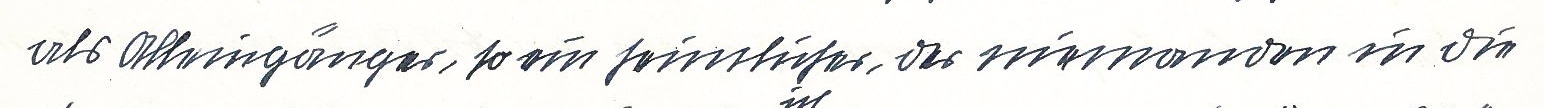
als Alleingänger, so ein heimlicher, der niemanden in die
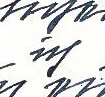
ich
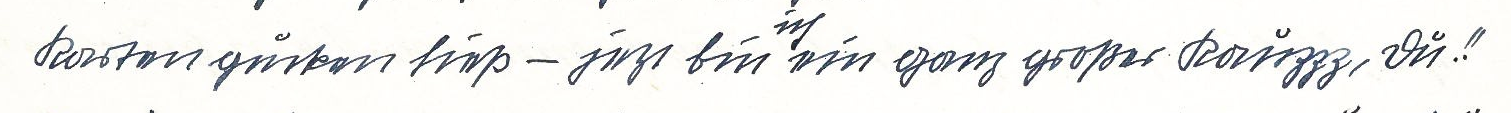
Karten gucken ließ – jetzt bin ein ganz großer Kauzzz, Du!!
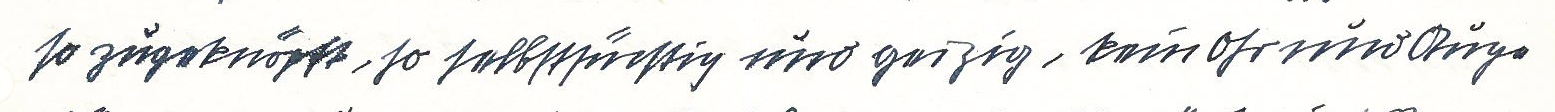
so zugeknöpft, so selbstsüchtig und geizig, kein Ohr und Auge
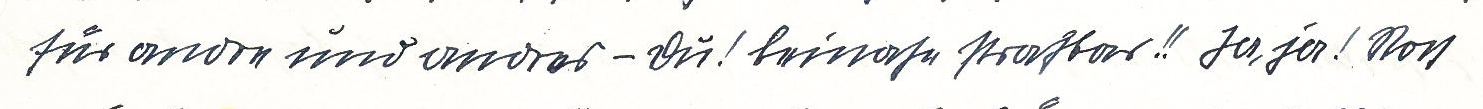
für andre und andres – Du! beinahe strafbar!! Ja, ja! Noch
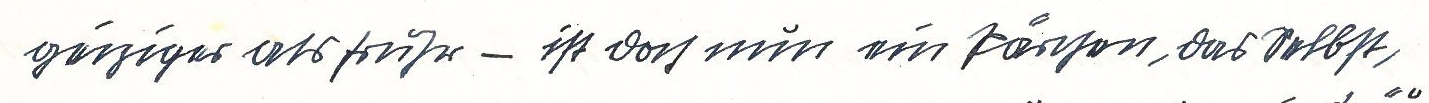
geiziger als früher – ist doch nun ein Pärchen, das Selbst,
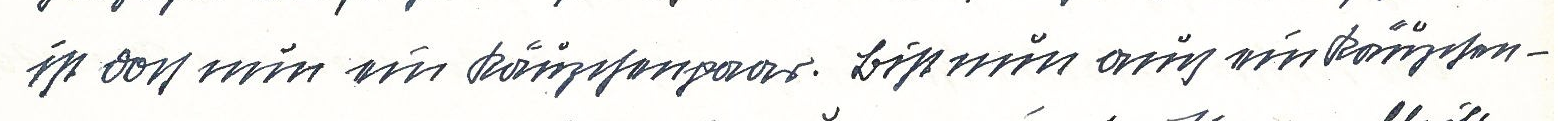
ist doch nur ein Käuzchenpaar. Bist nun auch ein Käuzchen –
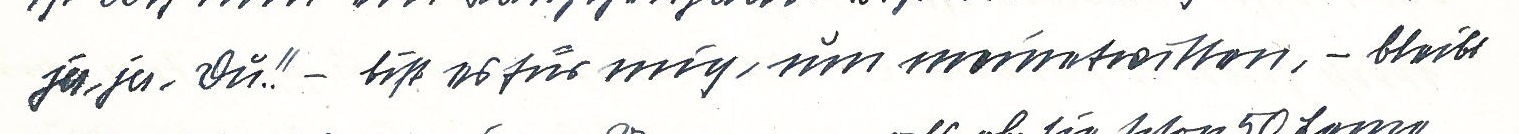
ja, ja, Du!! – bist es für mich, um meinetwillen, – bleibt
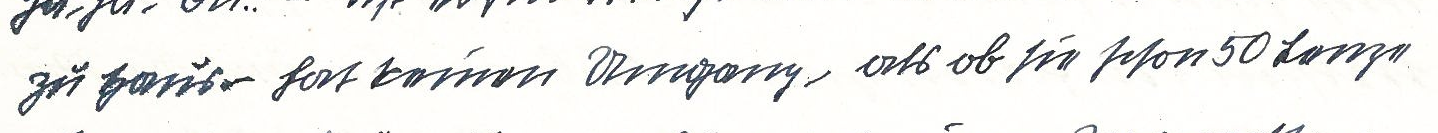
zu Haus – hat keinen Ausgang, als ob sie schon 50 Lenze
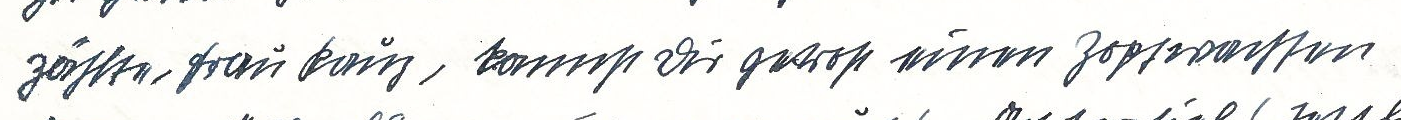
zählte, Frau Kauz, kannst Dir getrost einen Zopf wachsen
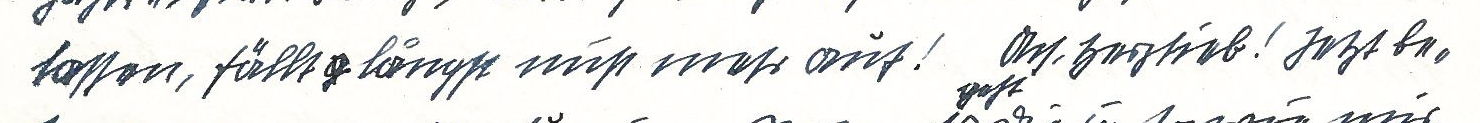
lassen, fällt längst nicht mehr auf! Ach Herzlieb! Jetzt be¬
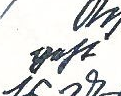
geht
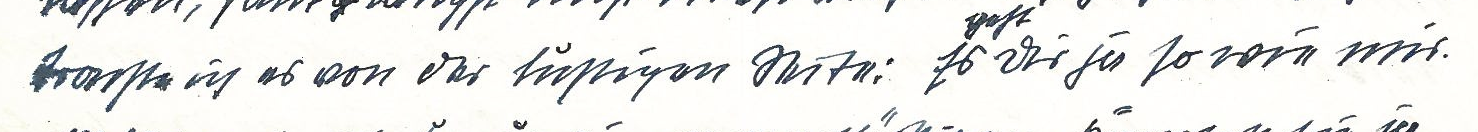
trachte ich es von der lustigen Seite: Es Dir ja so wie mir.
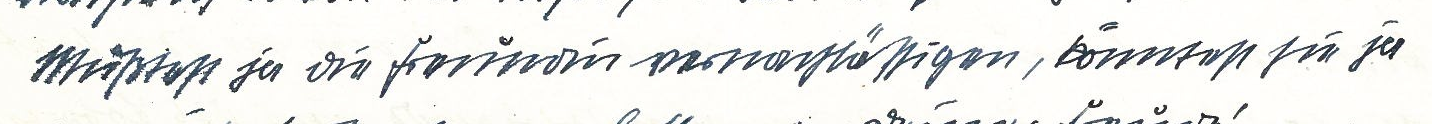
Mußtest ja die Freundin vernachlässigen, könntest sie ja
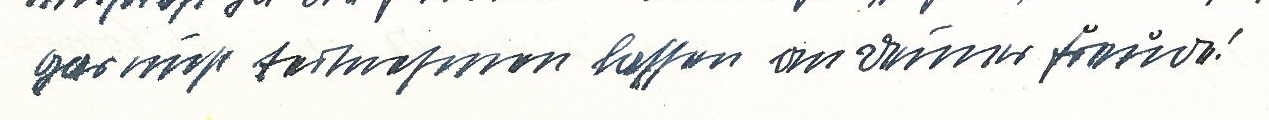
gar nicht teilnehmen lassen an Deiner Freude!
